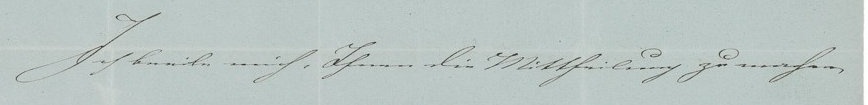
Ich beeile mich, Ihnen die Mittheilung zu machen,
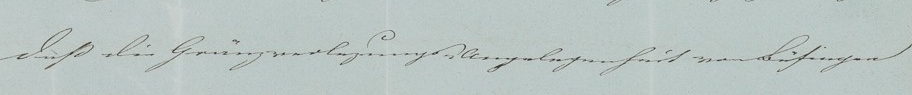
daß die Gränzverlegungs-Angelegenheit von Büsingen
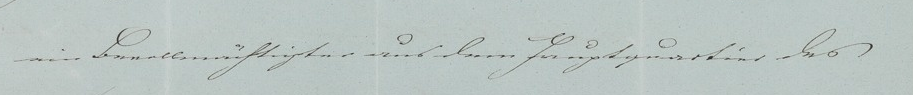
ein Bevollmächtigter aus dem Hauptquartier des
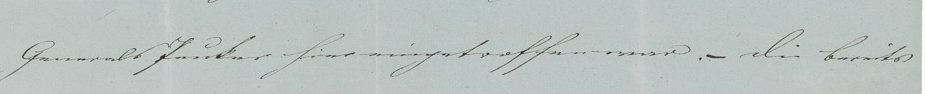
Generals Peuker hier eingetroffen war. – Die bereits
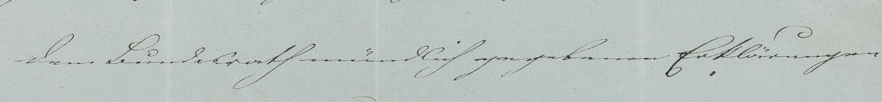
dem Bundesrath mündlich gegebenen Erklärungen
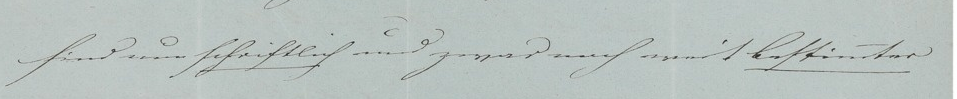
sind nun schriftlich und zwar noch weit bestimmter
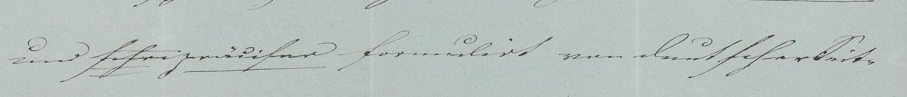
und sehrpräciser formulirt von deutscher Seite
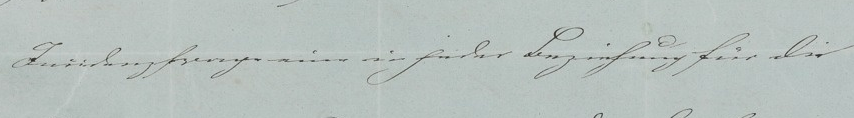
Incidenzfrage eine in jeder Beziehung für die
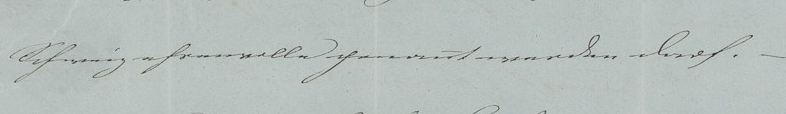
Schweiz ehrenvolle genannt werden darf. –
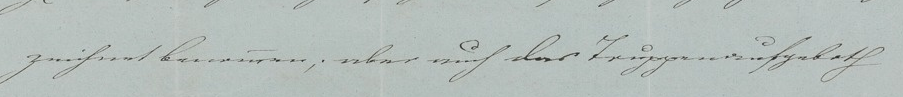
zeichnet benommen; aber auch das Truppenaufgeboth
